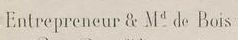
Entrepreneur & Md de Bois
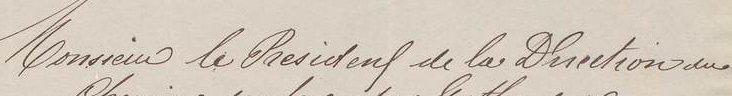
Monsieur le President de la Direction du
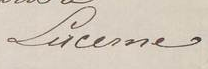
Lucerne
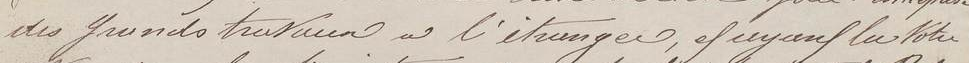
des Grands travaux a l'étranger, et ayant lu Votre
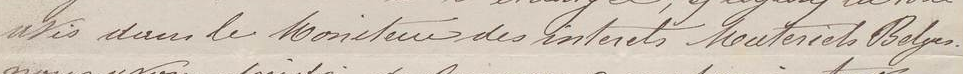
avis dans le Moniteur des interets Materiels Belges,
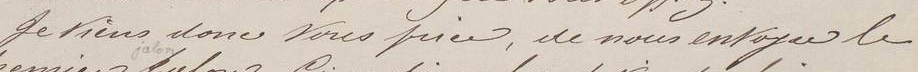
Je viens donc Vous prier, de nous envoyer le
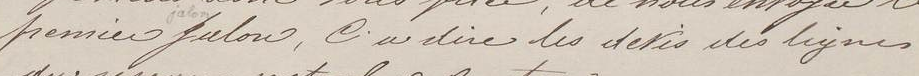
premier jalon , C. a dire les devis des lignes
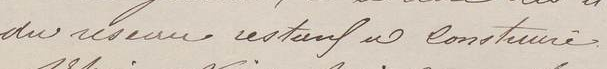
du reseau restant a construire.
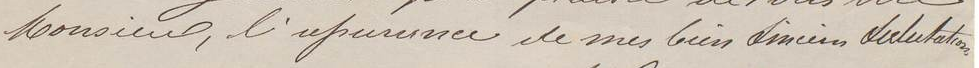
Monsieur, l'assurance de mes bien sincères salutations
